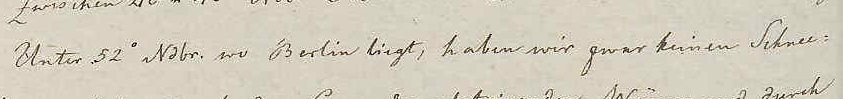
Unter 52° Ndbr. wo Berlin liegt, haben wir zwar keinen Schnee-
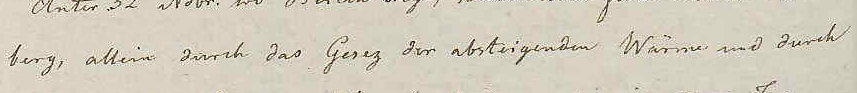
berg, allein durch das Gesez der absteigenden Wärme und durch
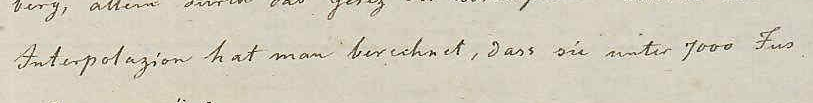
Interpolazion hat man berechnet, dass sie unter 7000 Fus
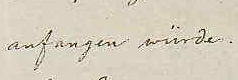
anfangen würde.
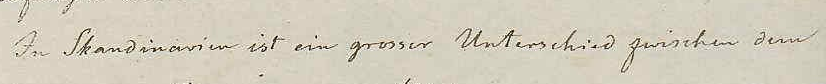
In Skandinavien ist ein grosser Unterschied zwischen dem
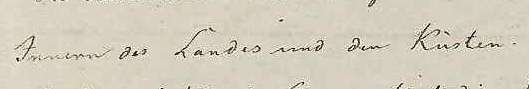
Innern des Landes und den Küsten.
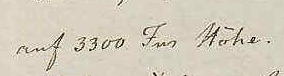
auf 3300 Fus Höhe.
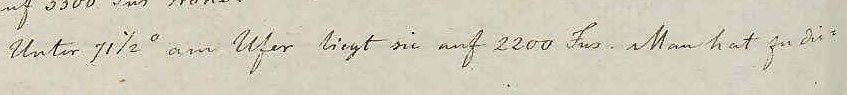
Unter 71½° am Ufer liegt sie auf 2200 Fus. Man hat zu die-
